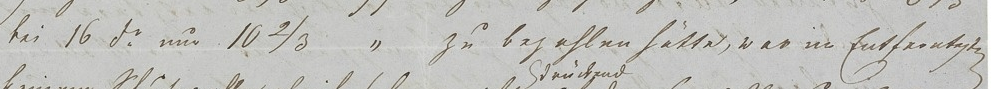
bei 16 Fr nur 10⅔ " zu bezahlen hätte, was im Entferntesten
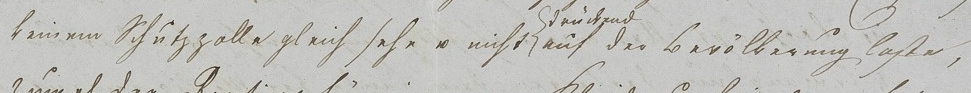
keinem Schutzzolle gleich sehe & nicht drückend auf der Bevölkerung laste,
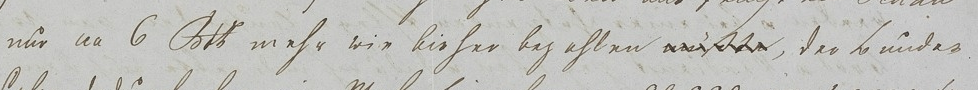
nur cca 6 Btz mehr wie bisher bezahlen müßte, der Bundes
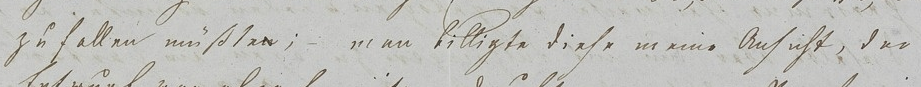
zufallen müßten; – man billigte diese meine Ansicht, der
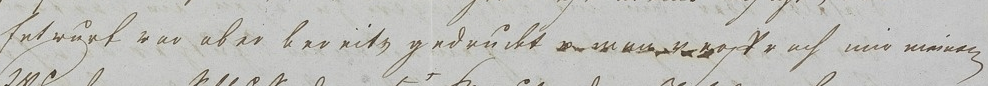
Entwurf war aber bereits gedruckt & man versprach mir meinem
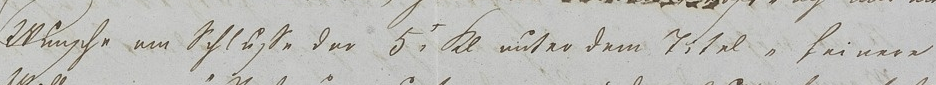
Wunsche am Schlusse der 5t Kl unter dem Titel «feinere
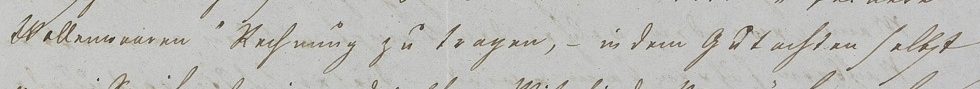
Wollenwaaren» Rechnung zu tragen, – in dem Gutachten selbst
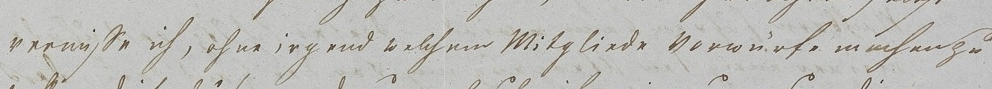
vermisse ich, ohne irgend welchem Mitgliede Vorwürfe machen zu
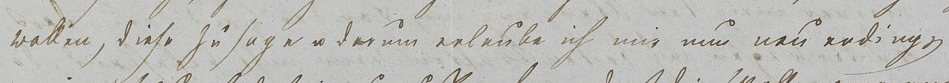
wollen, diese Zusage & darum erlaube ich mir nun neuerdings
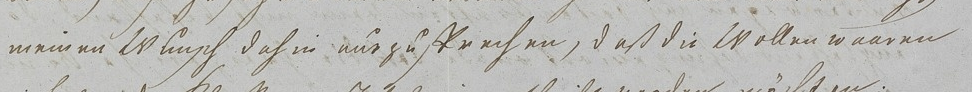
meinen Wunsch dahin auszusprechen, daß die Wollenwaaren
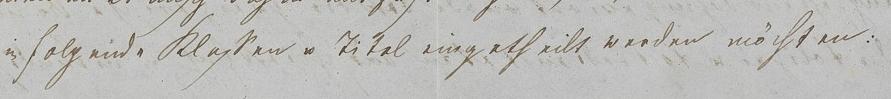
in folgende Klassen & Titel eingetheilt werden möchten:
